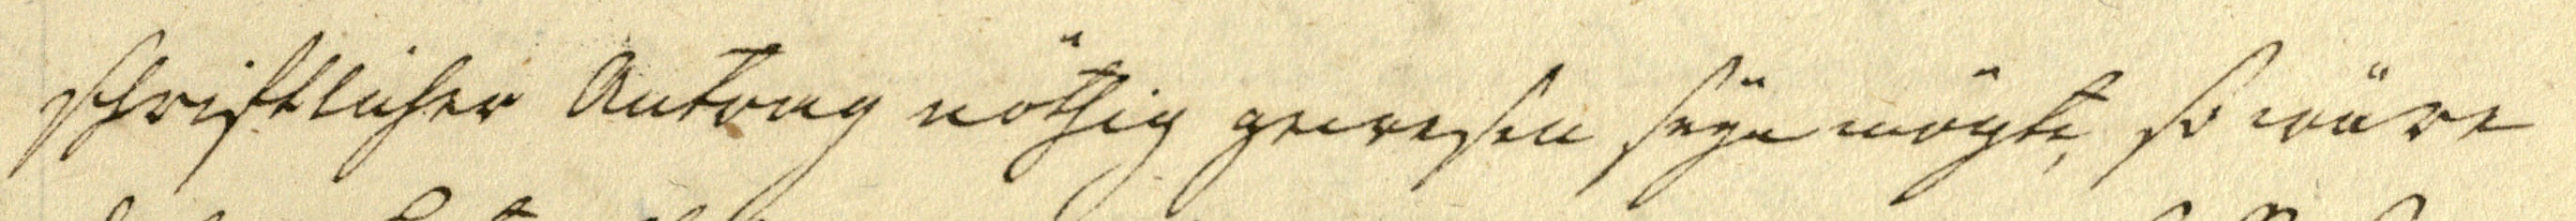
schriftliche Antrag nöthig gewesen seÿn mögte, so wäre
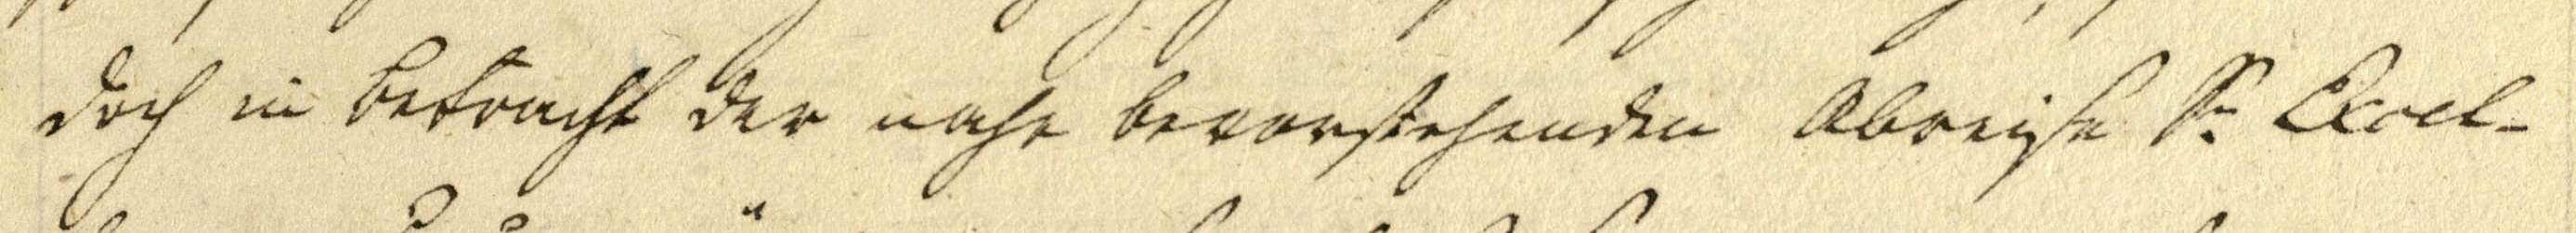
doch in Betracht der nahe bevorstehenden Abreise Sr. Excel¬
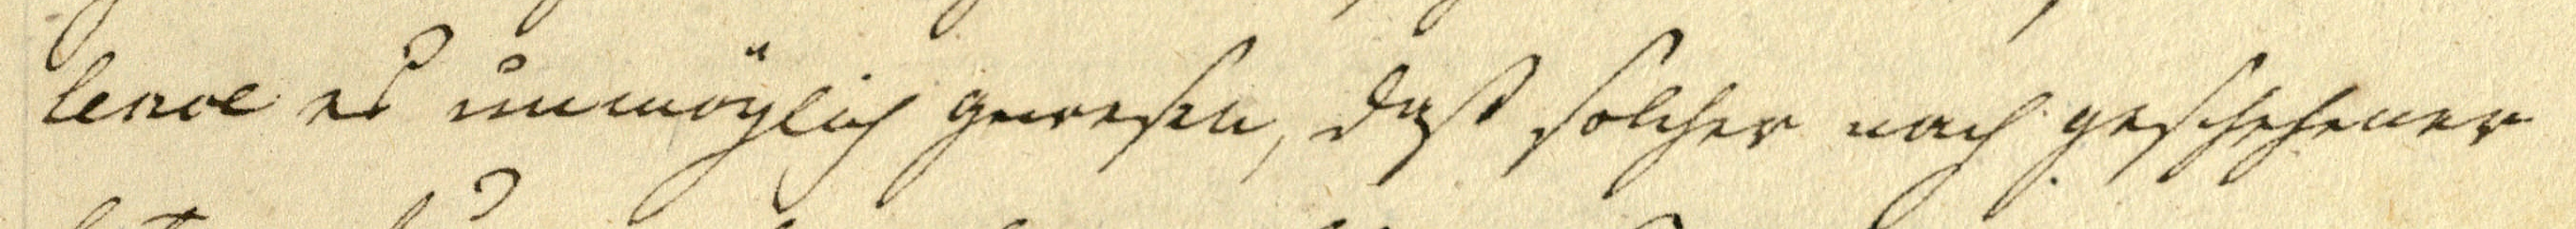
lence es unmöglich gewesen, daß solcher nach geschehener
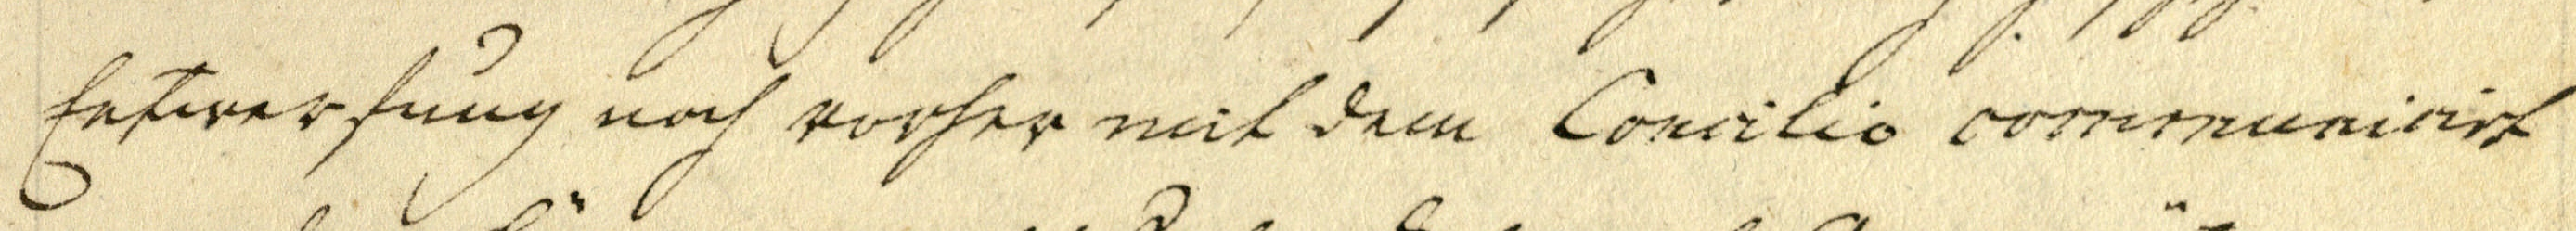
Entwerfung noch vorher mit dem Concilio communicirt
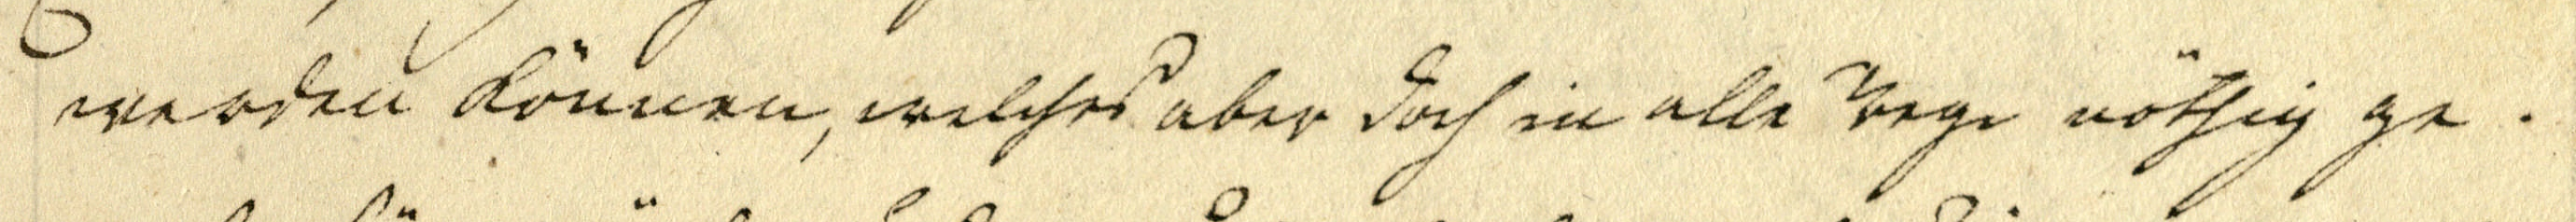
werden können, welches aber doch in alle Wege nöthig ge¬
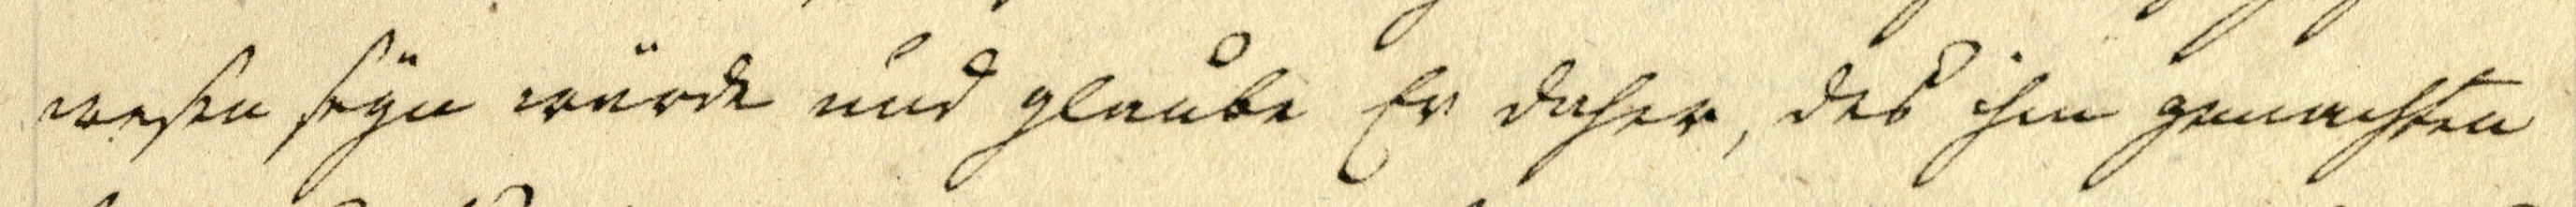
wesen seÿn würde und glaube Er daher, des ihm gemachten
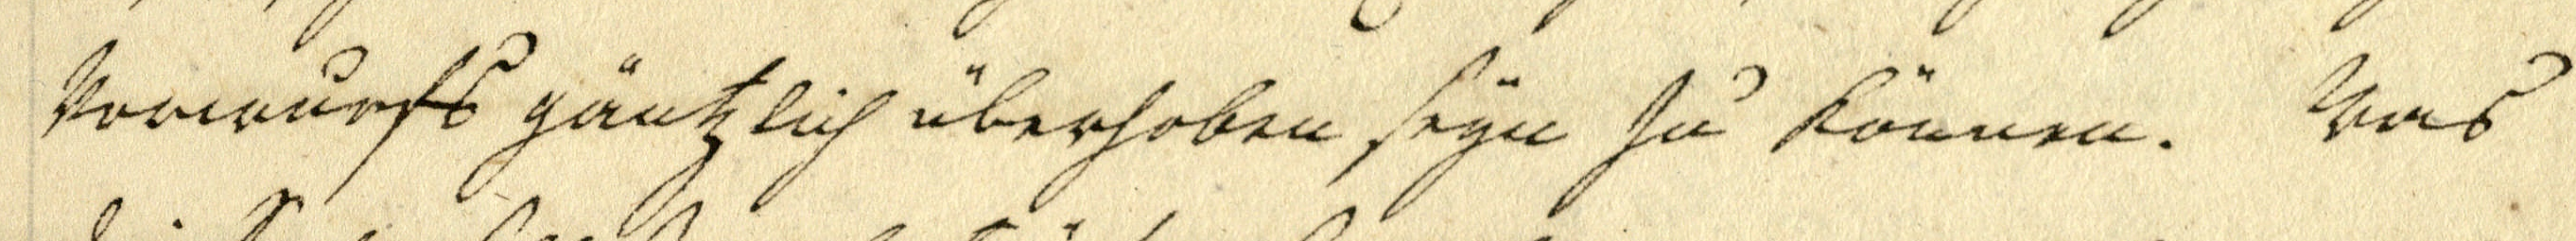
Vorwurfs gäntzlich überhoben seÿn zu können. Was
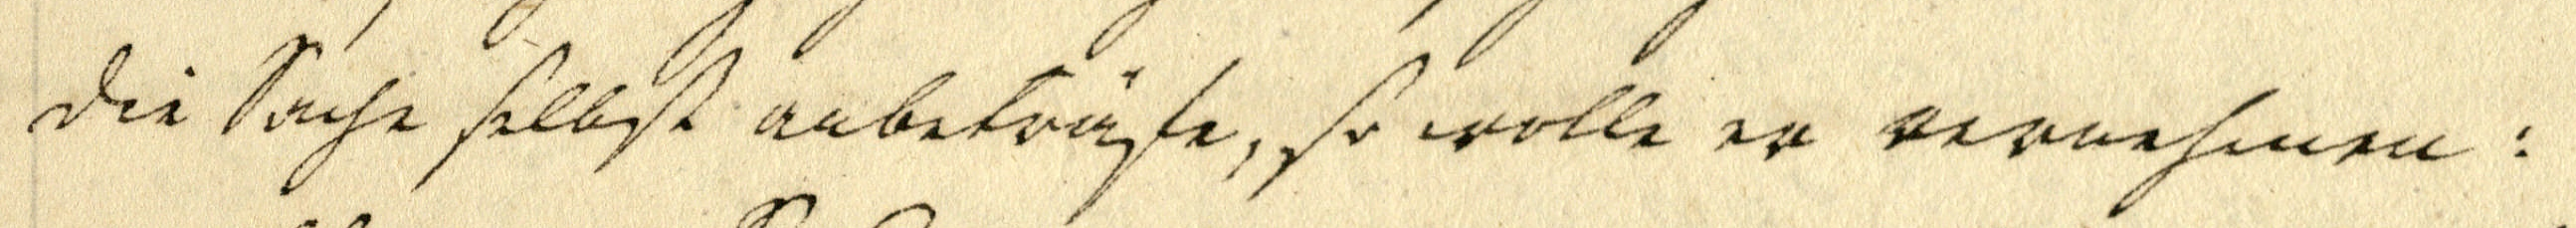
die Sache selbst anbeträfe, so wolle er vernehmen:
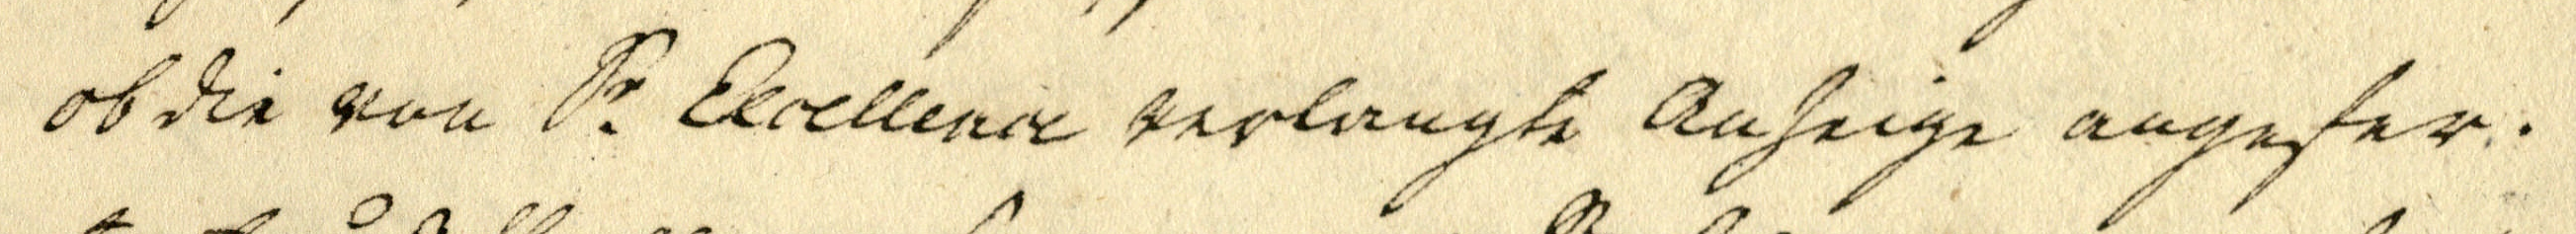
ob die von Sr. Excellence verlangte Anzeige angefer¬
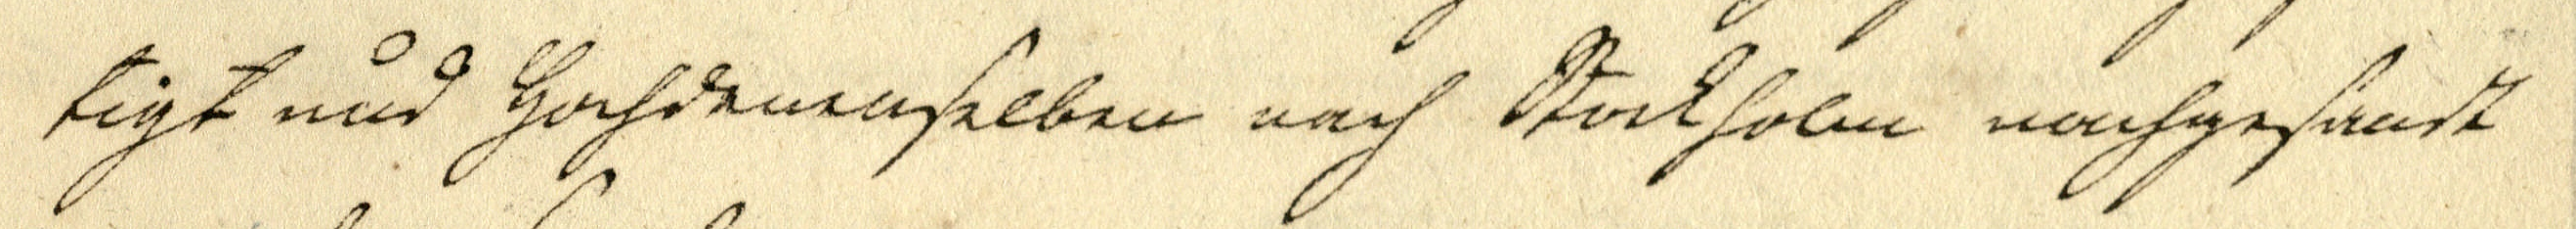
tigt und Hochdenenselben nach Stockholm nachgesandt
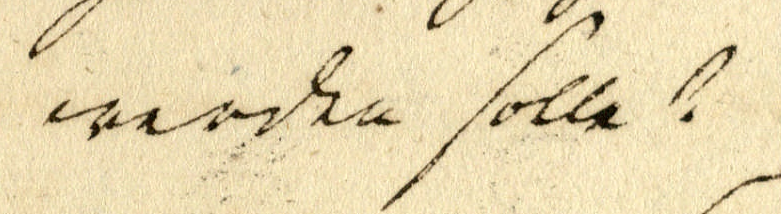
werden solle?
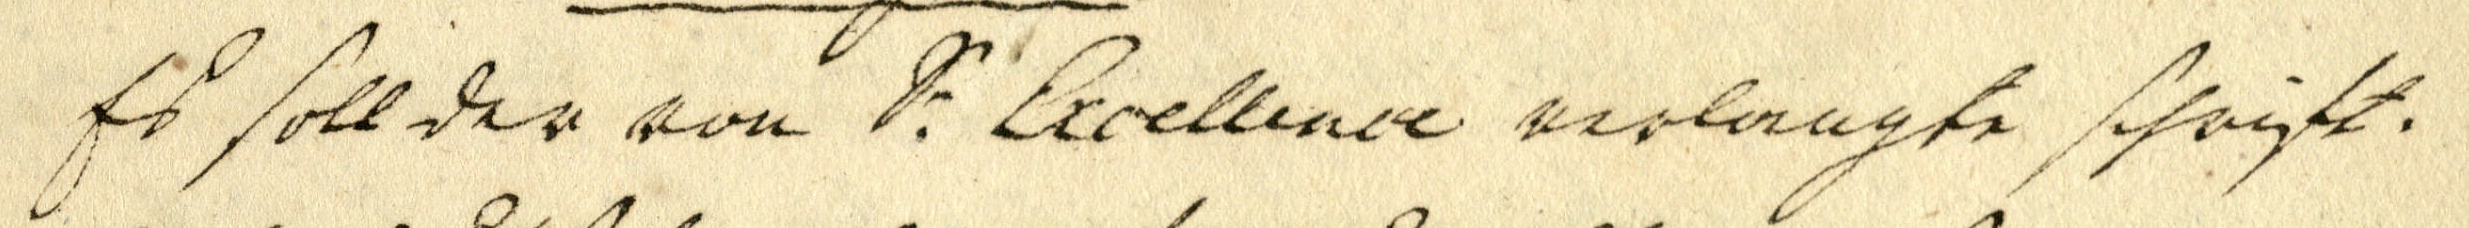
Es soll der von Sr. Excellence verlangte schrift¬
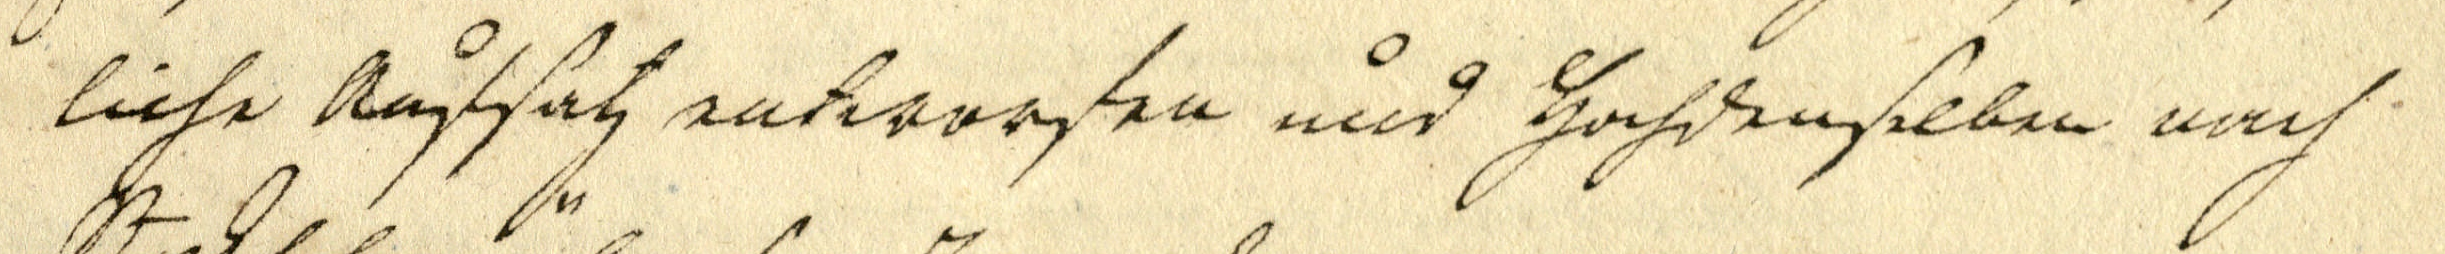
liche Aufsatz entworfen und Hochdenselben nach
